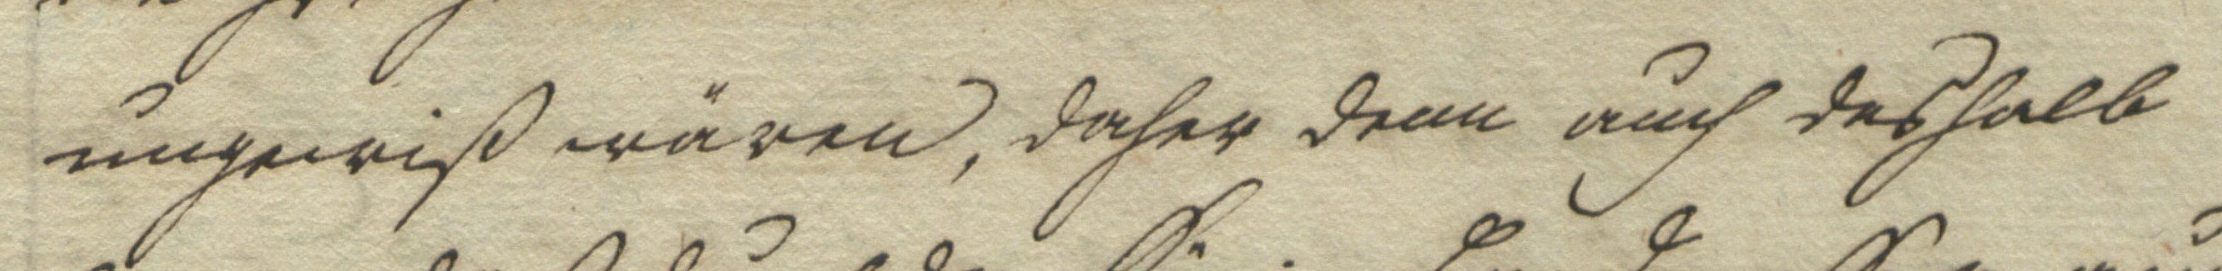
ungewiß wären, daher denn deshalb
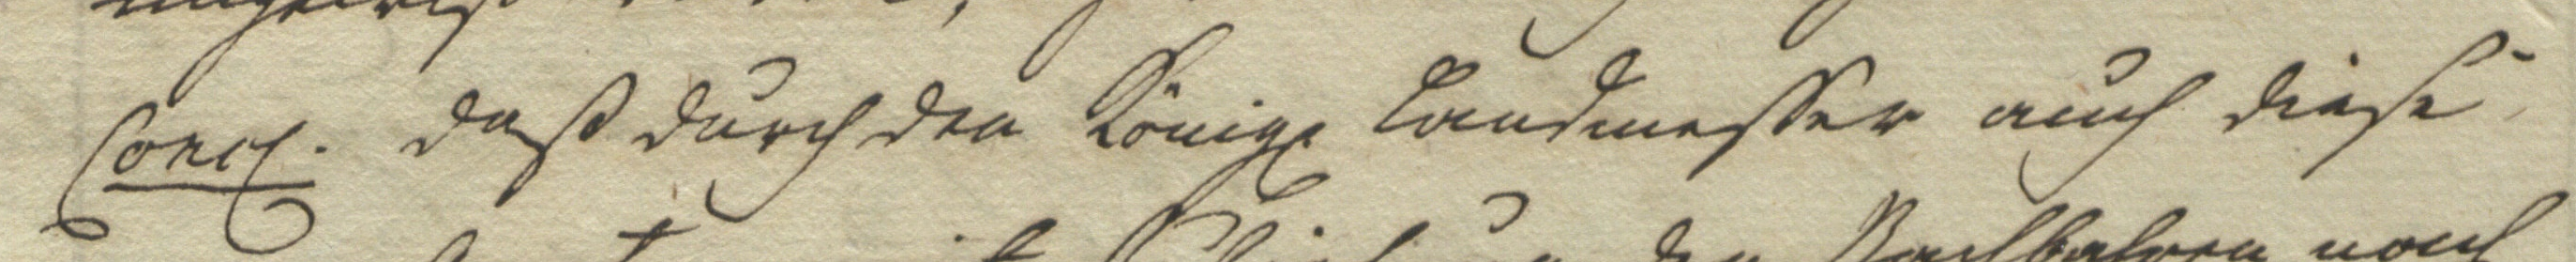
Concl. Daß durch den Königl. Landmesser auch diese
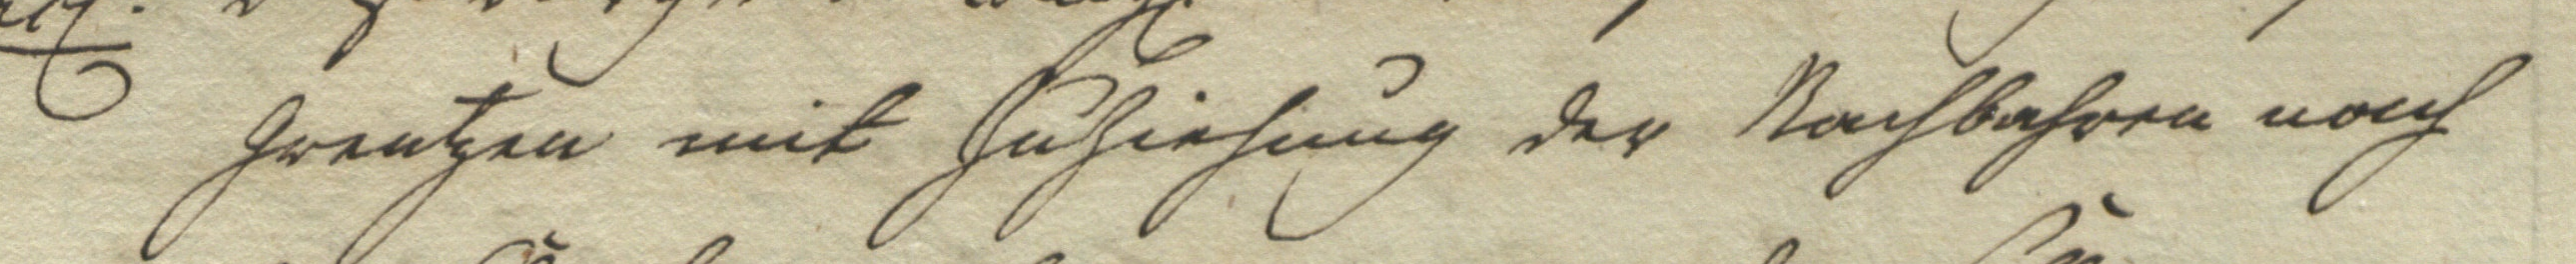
Grentzen mit Zuziehung der Nachbahren nach
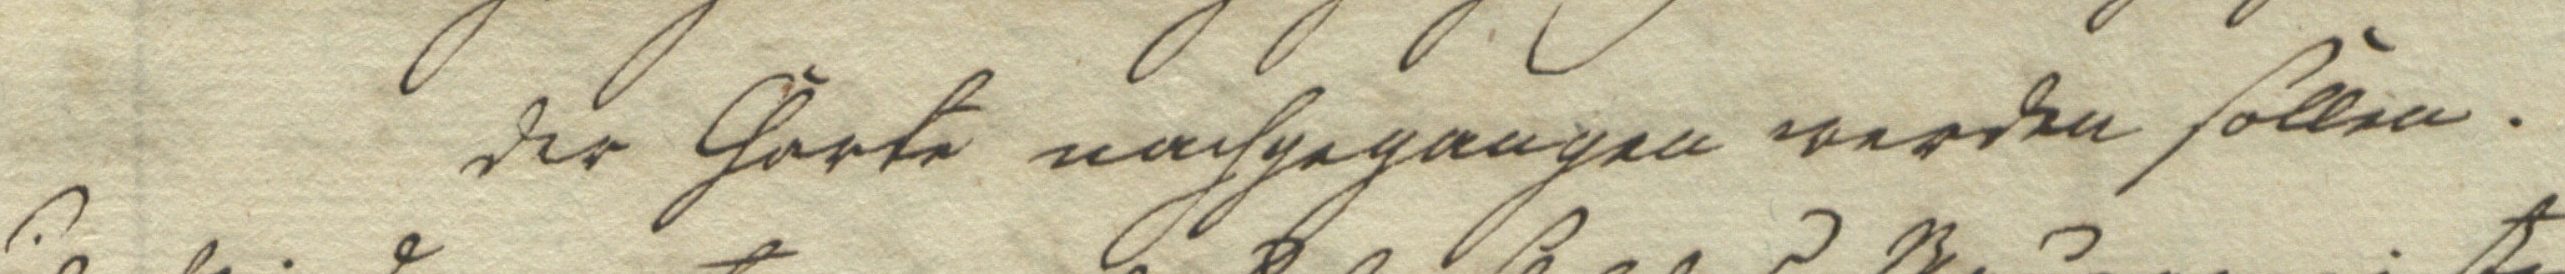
der Charte nachgegangen werden sollen.
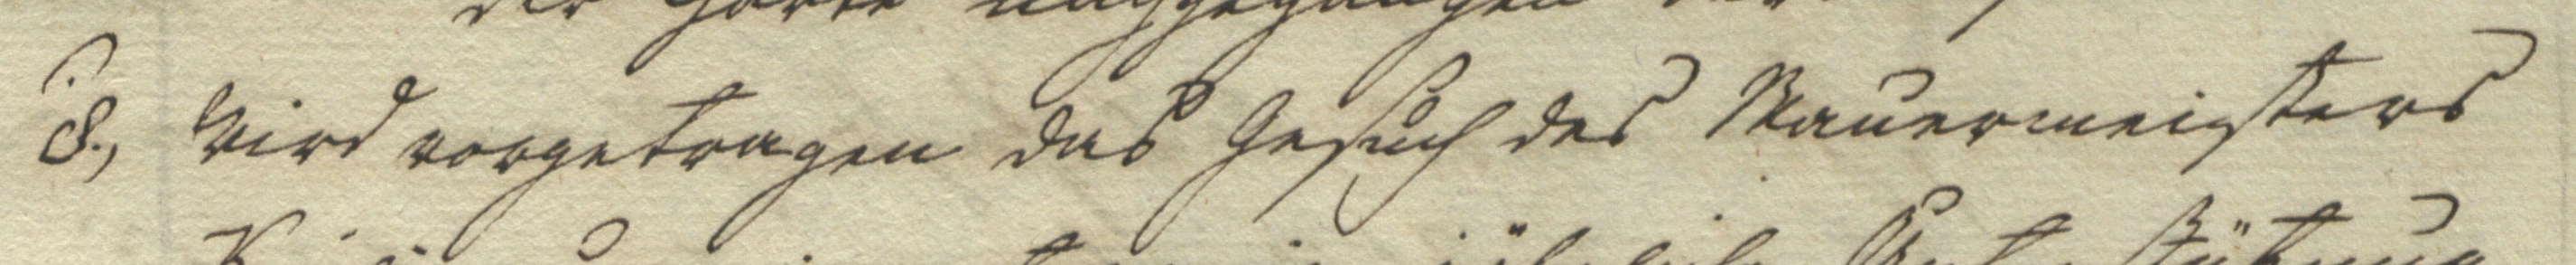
8., Wird vorgetragen daß Gesuch des Mauermeisters
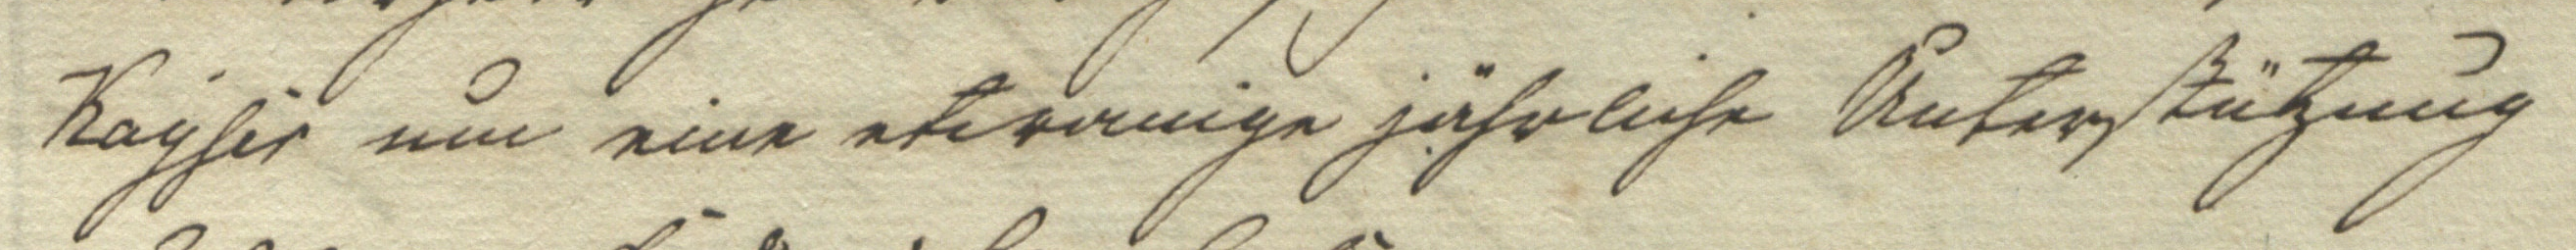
Kayser um eine etwanige jährliche Unterstützung
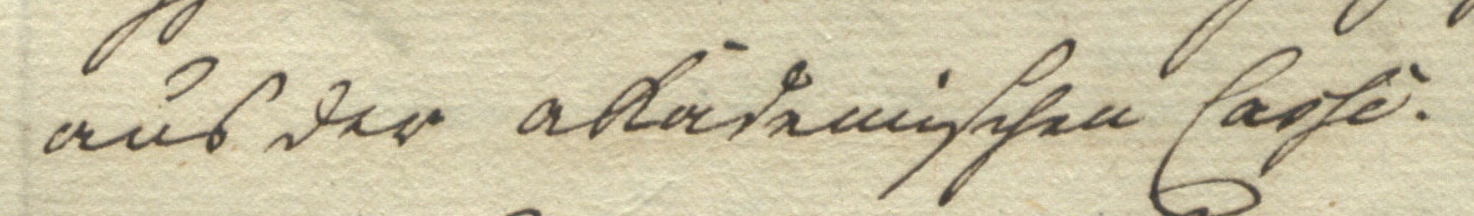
aus der akademischen Casse.
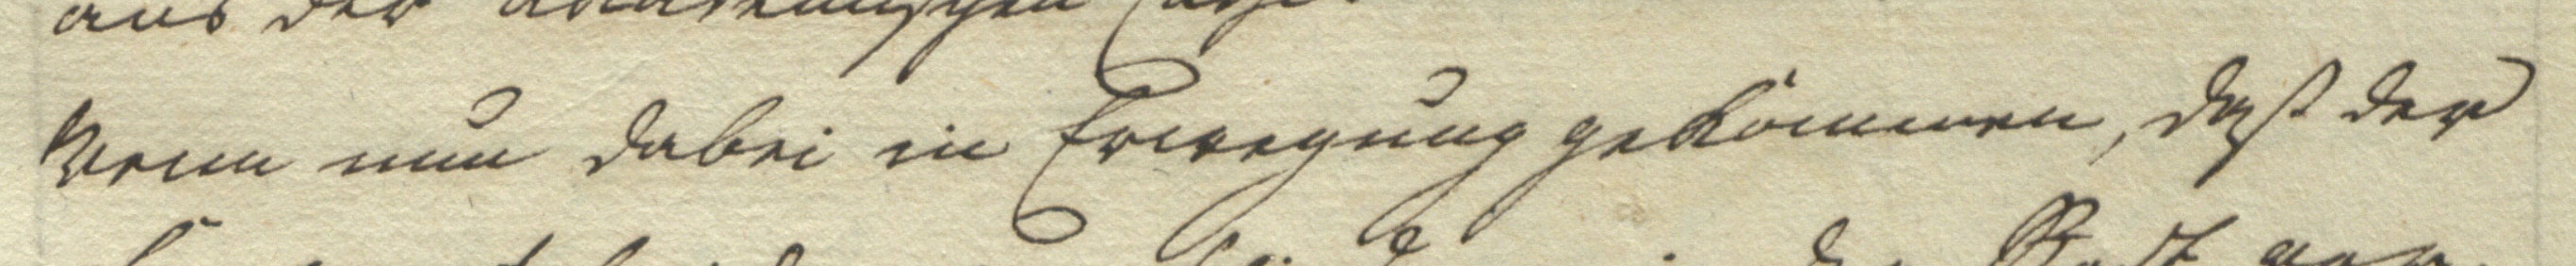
Wenn nun dabei in Erwegung gekommen, daß der
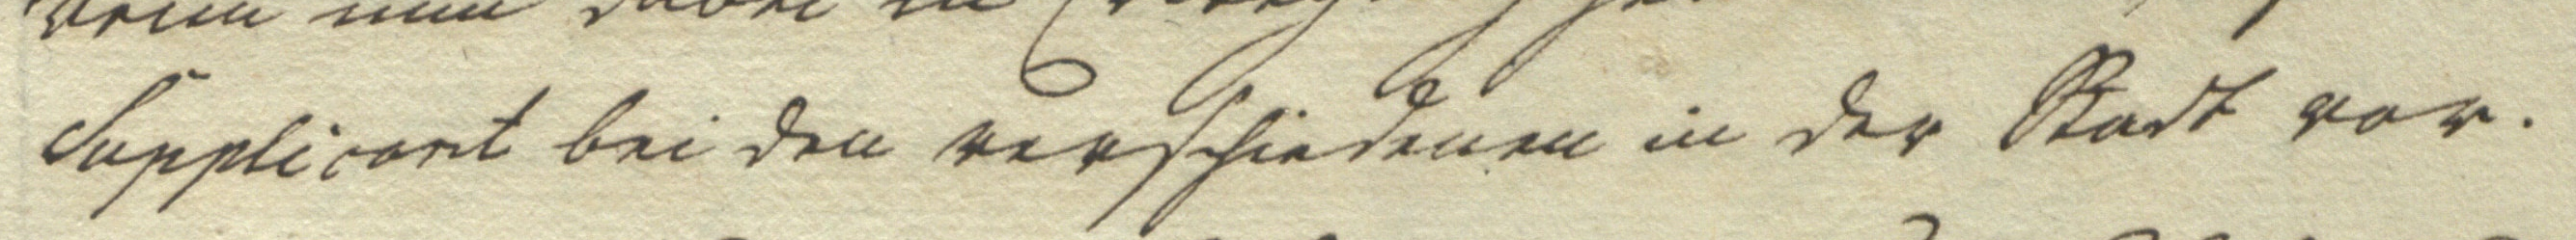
Supplicant bei den verschiedenen in der Stadt vor¬
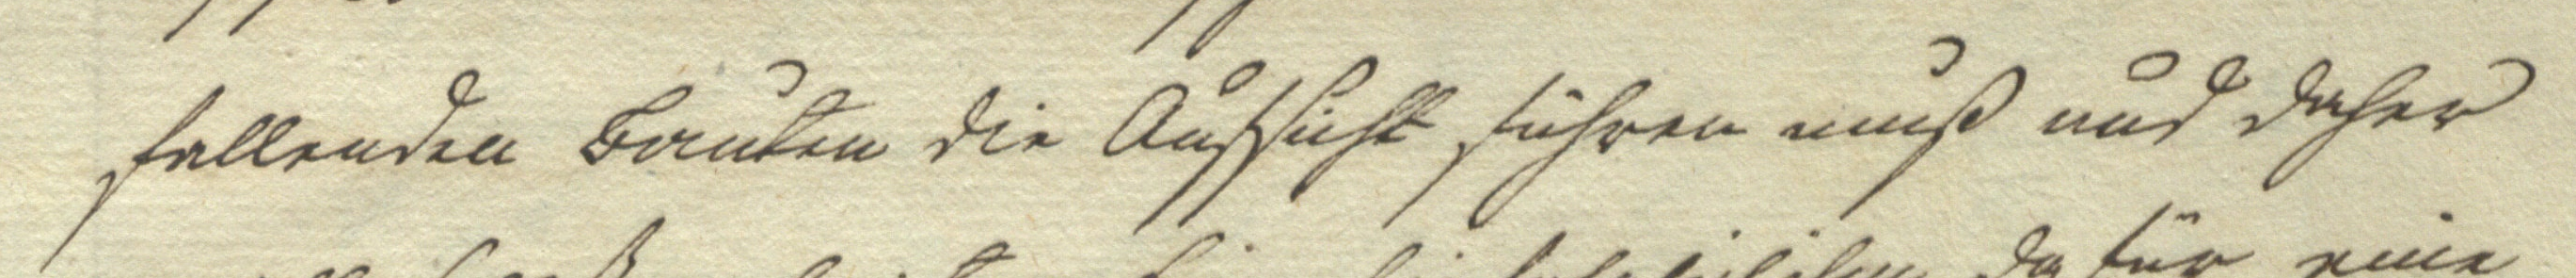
fallenden Bauten die Aufsicht führen muß und daher
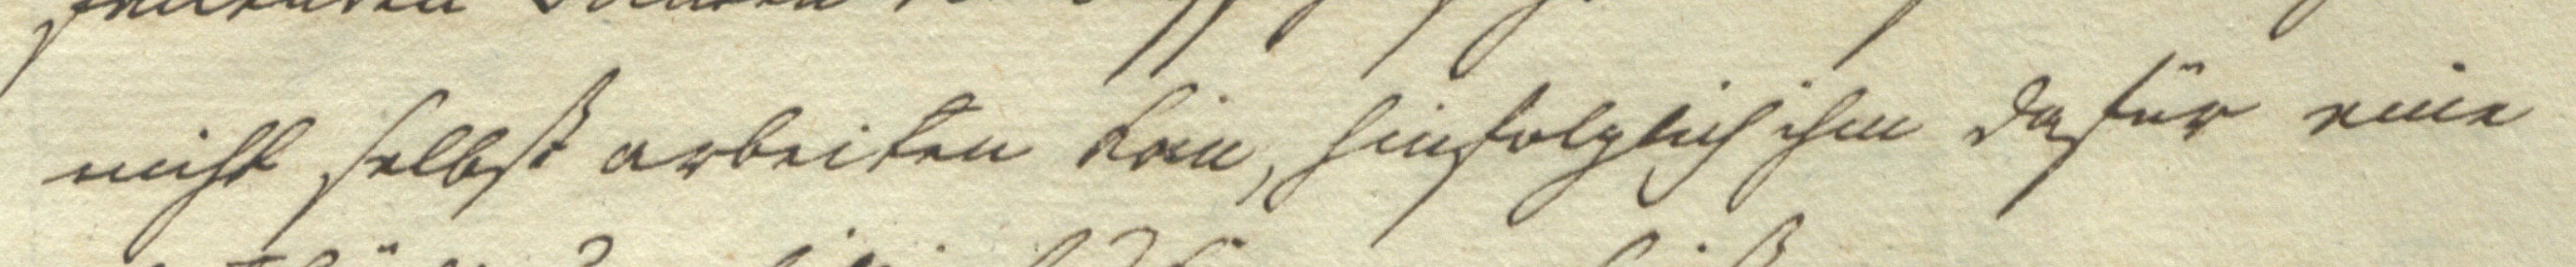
nicht selbst arbeiten kan, hinfolglich ihm dafür eine
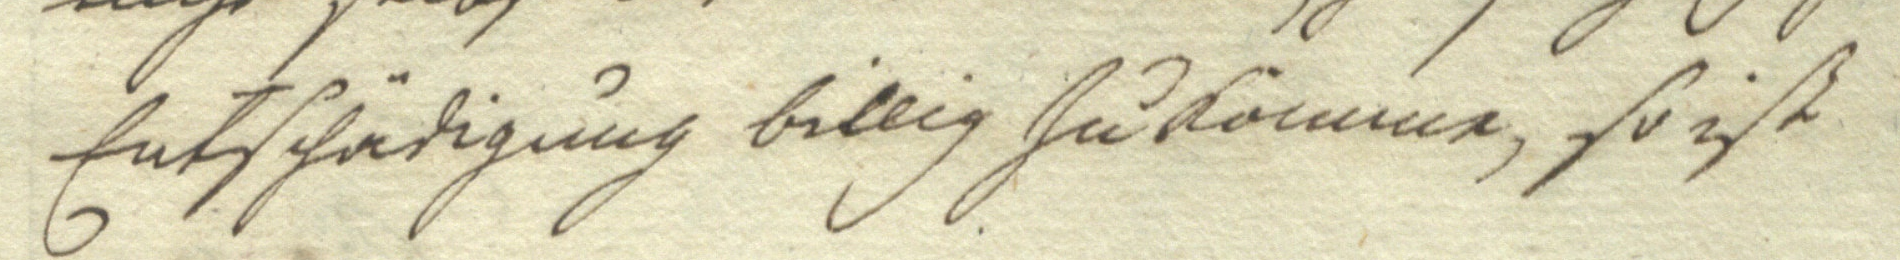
Entschädigung billig zukomme, so ist
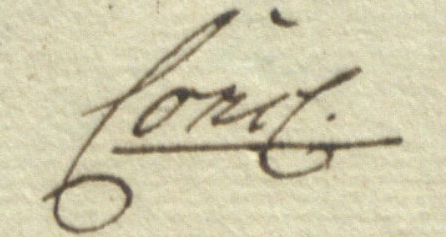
Concl.
